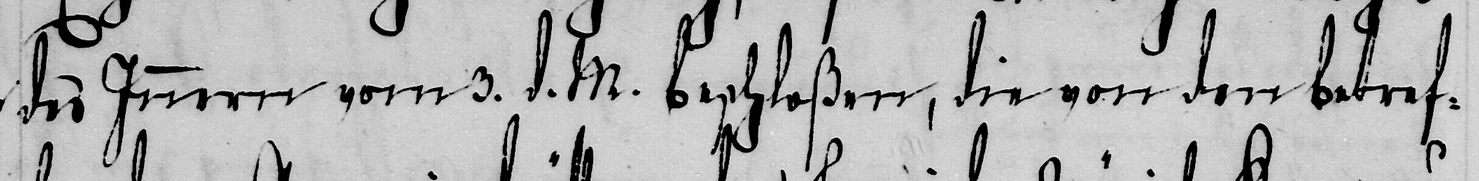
des Innern vom 3. d. M. beschloßen, die von den betref¬
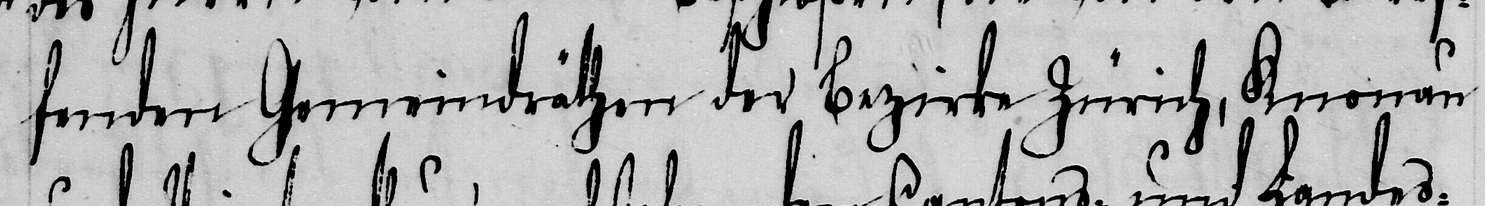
fenden Gemeindräthen der Bezirke Zürich, Knonau
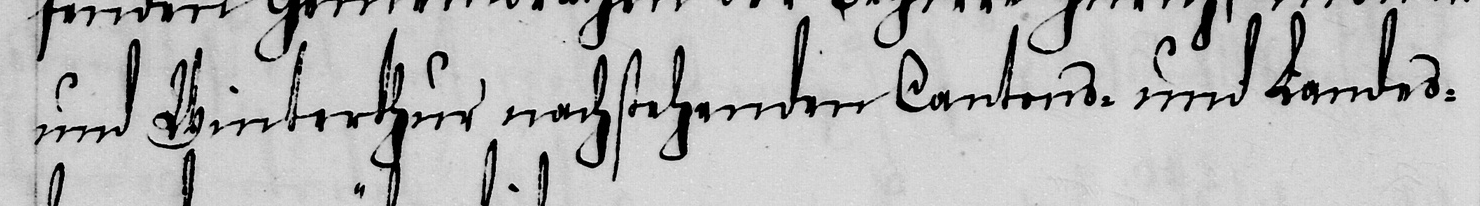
und Winterthur nachstehenden Cantons- und Landes¬
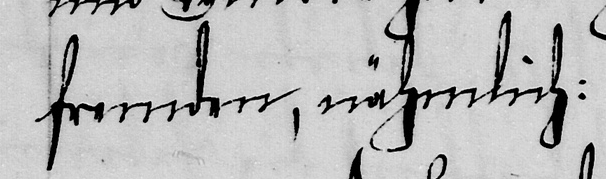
fremden, nähmlich:
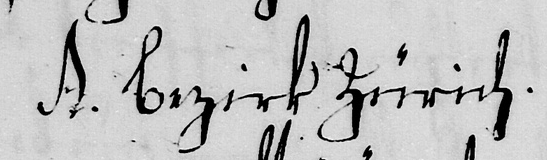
A. Bezirk Zürich.
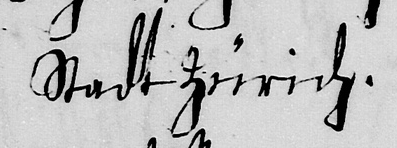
Stadt Zürich.
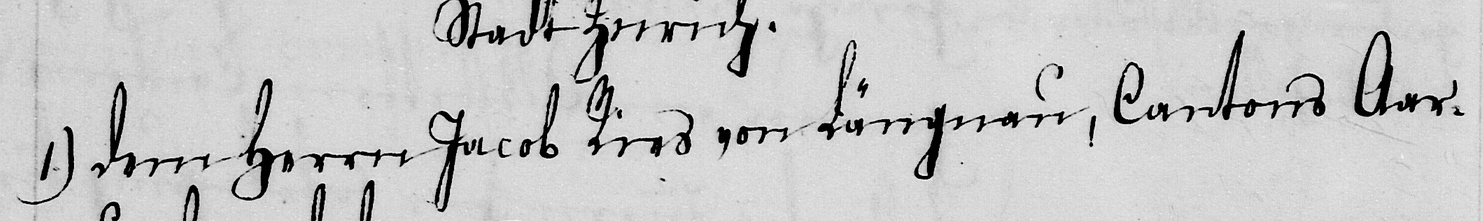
1.) dem Herrn Jacob Ries von Längnau, Cantons Aar¬
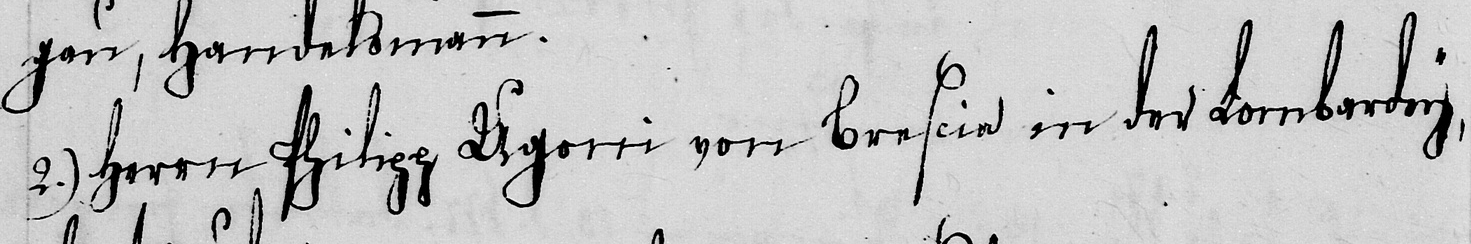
2.) Herrn Philipp Ugoni von Brescia in der Lombardey,
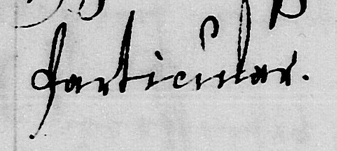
Patricular.
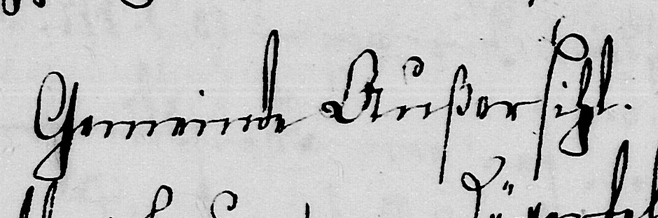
Gemeinde Außersihl.
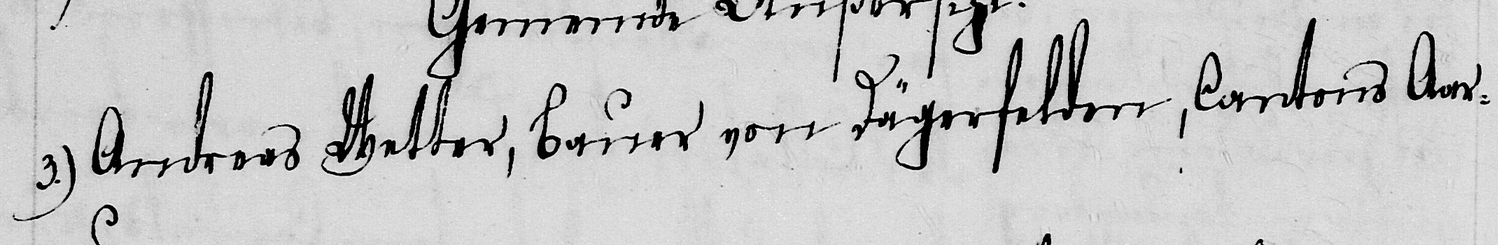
3.) Andreas Wetter, Bauer von Dägerfelden, Cantons Aar¬
